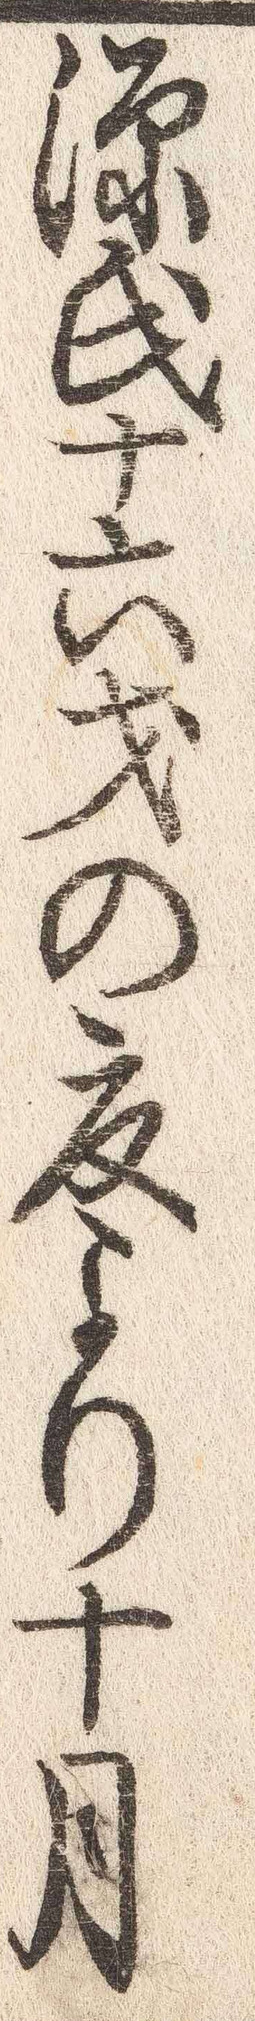源氏十六才の夏より十月
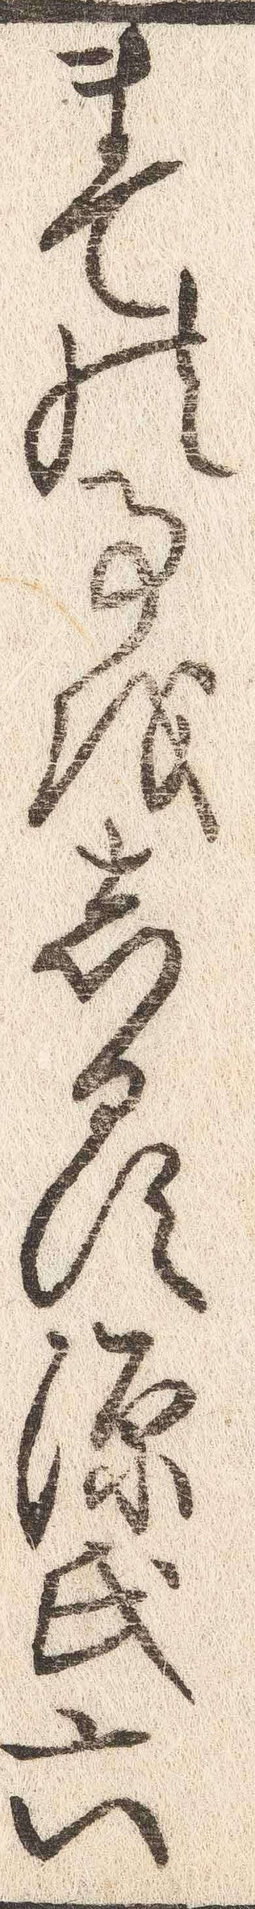まての事をしるす源氏六
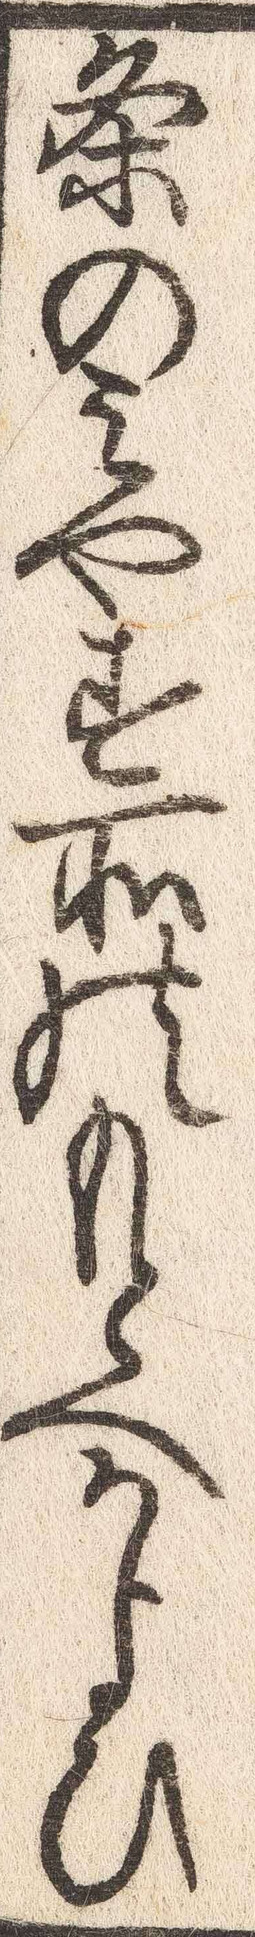条のみやす所のもとへかよひ
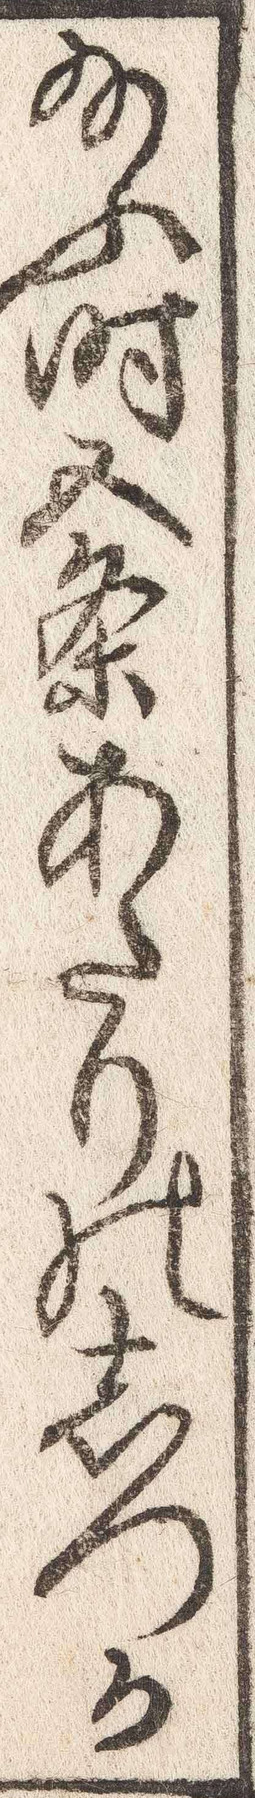給ふ時五条あたりのしつか
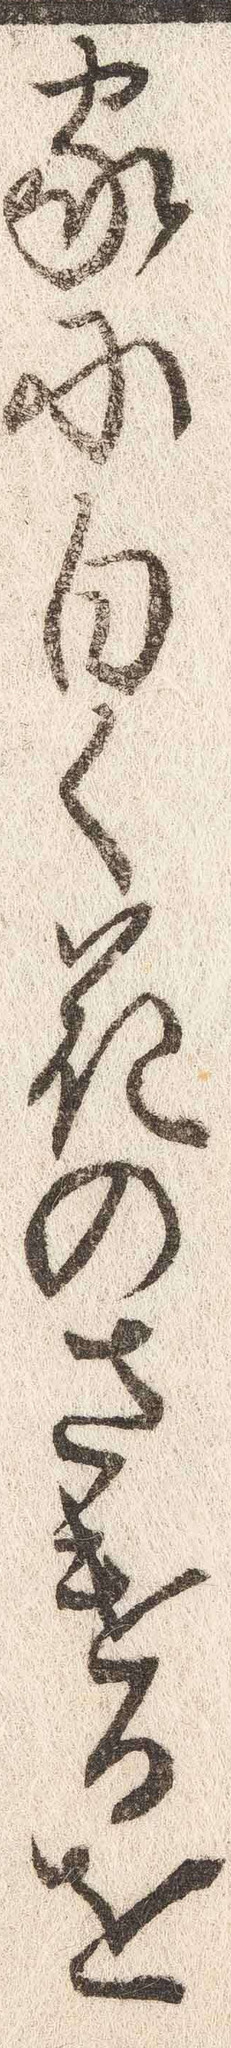家に白く花のさけるを
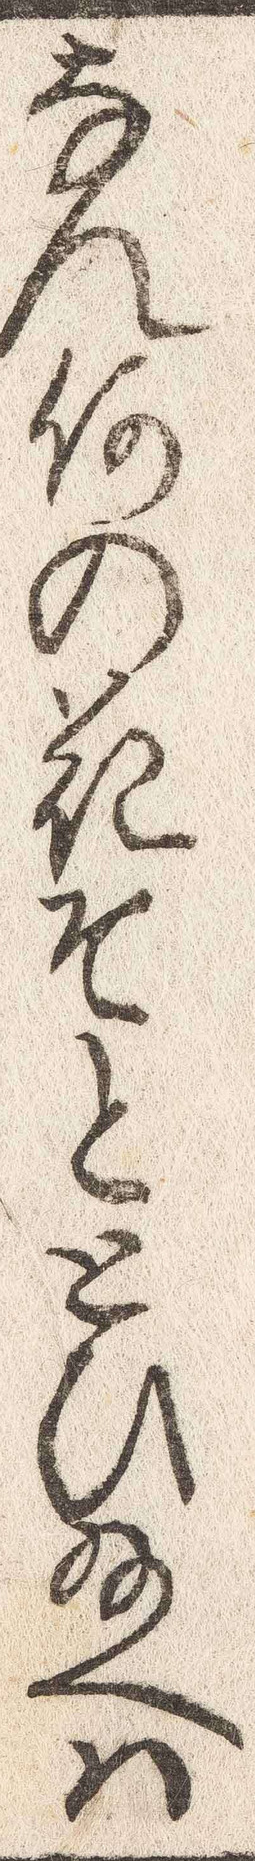なん何の花そととひ給へは
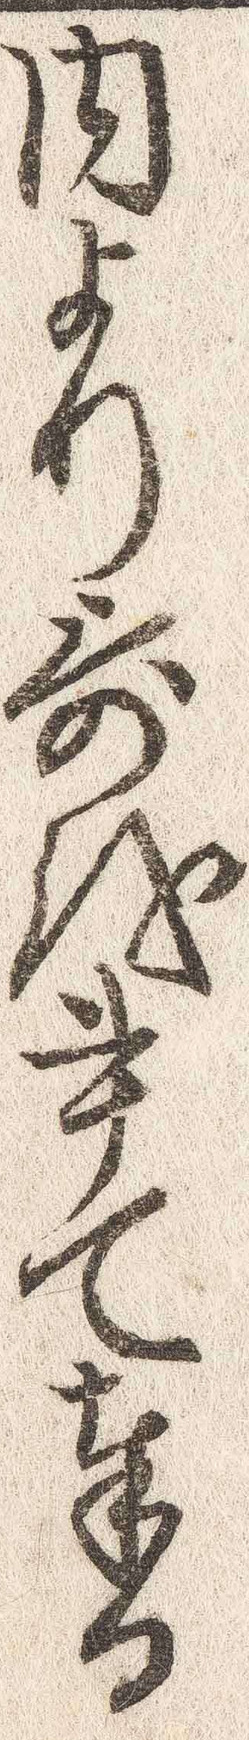内より歌を書て奉る
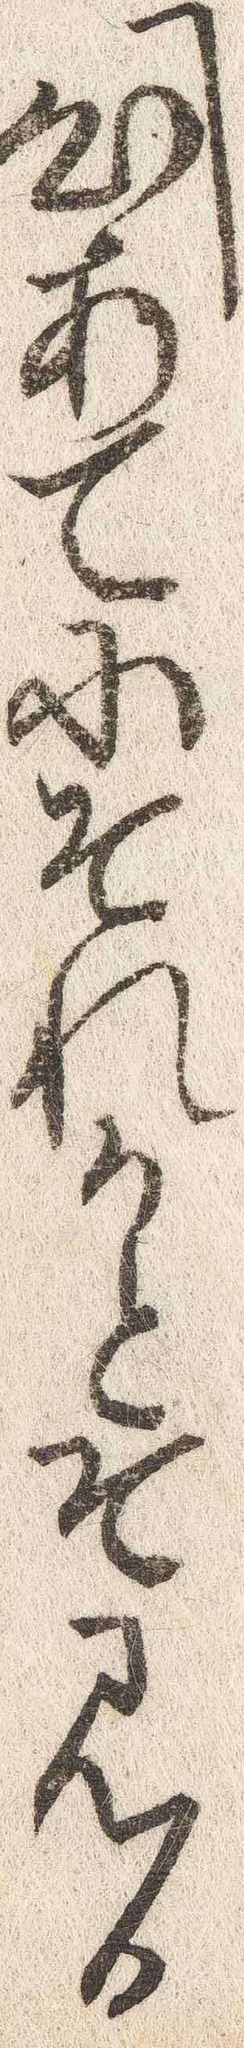〽心あてにそれかとそ見る

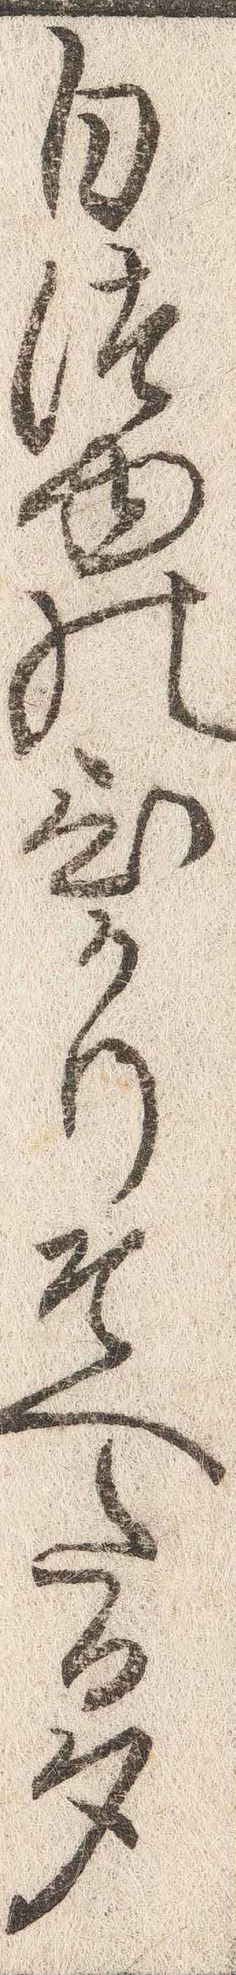白つゆのひかりそへたる夕
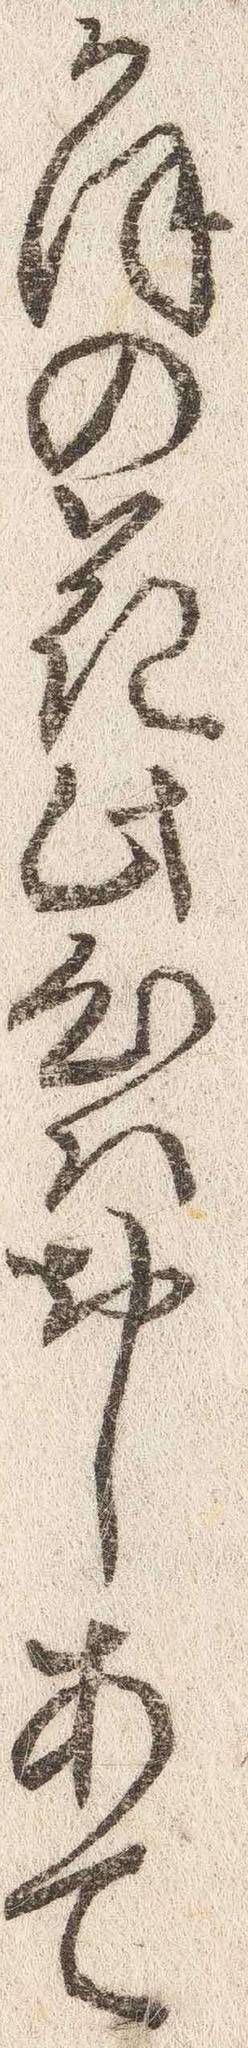かほの花此心はおしあて
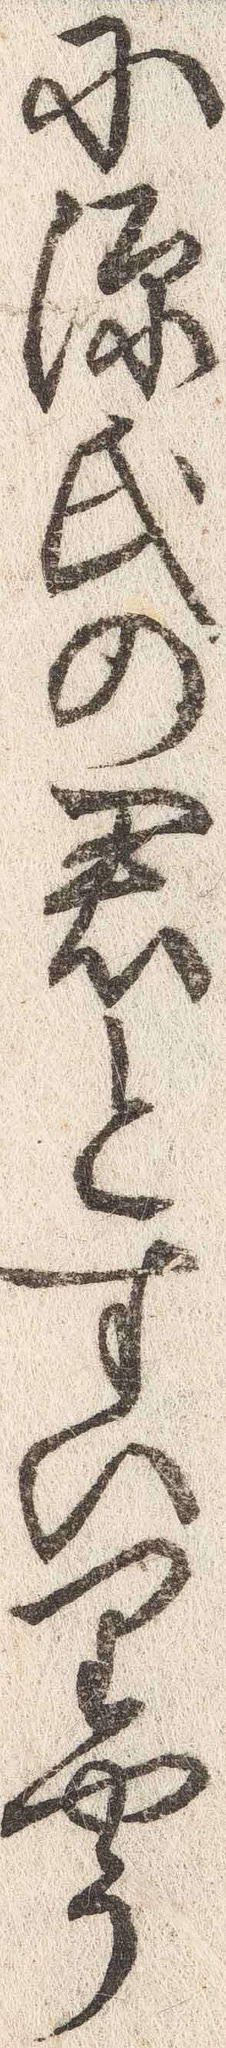に源氏の君とすいりやう
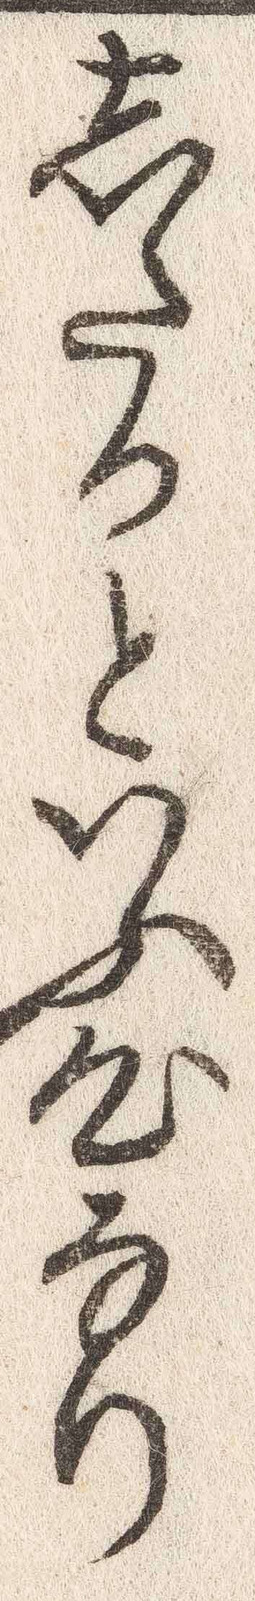したるといふ心なり
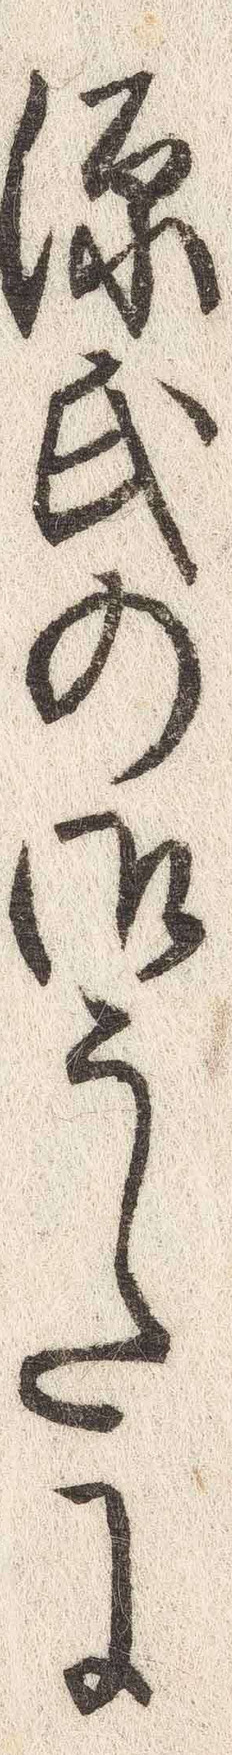源氏の御うたに
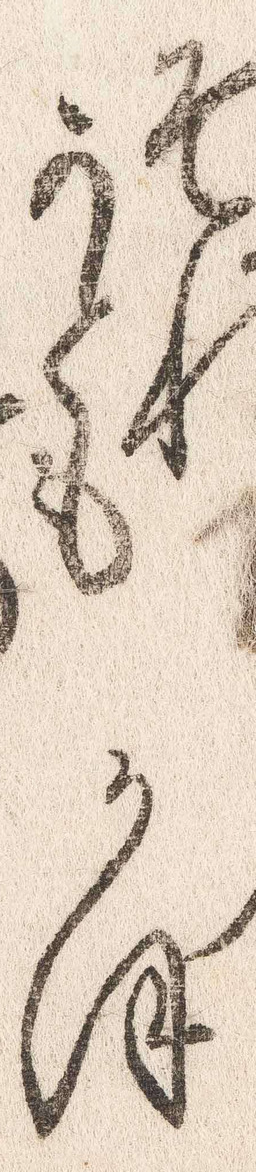かともかほ
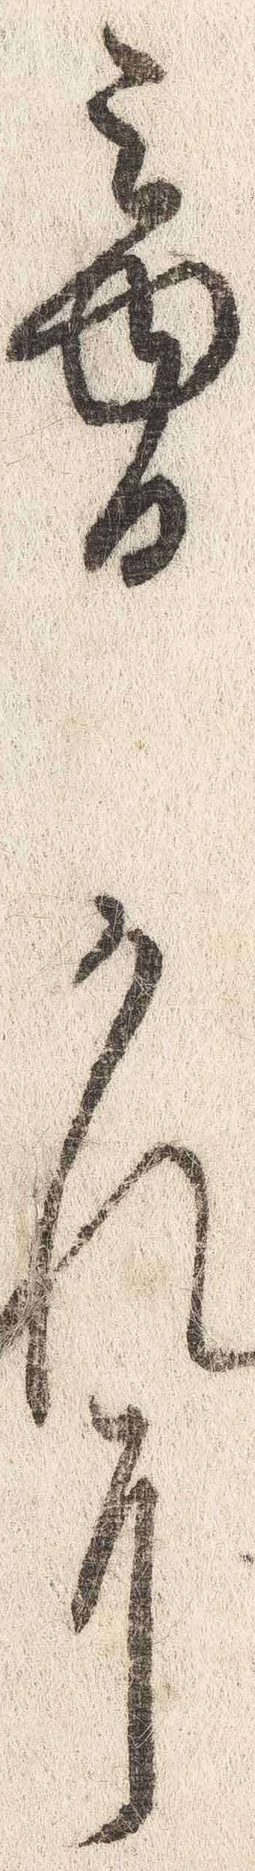みゆるかれに

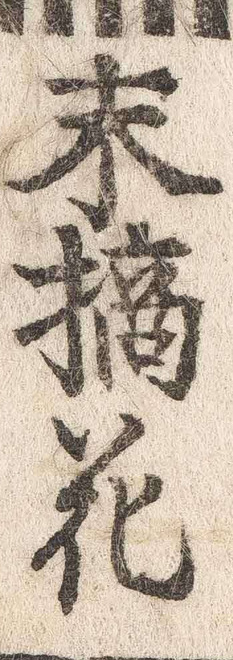末摘花
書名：源氏物語
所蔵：東京学芸大学附属図書館 国文学研究資料館
